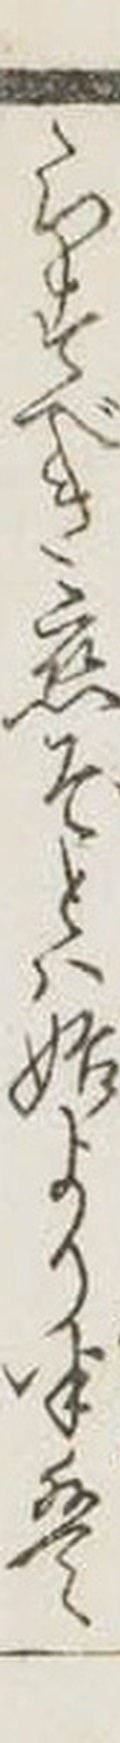らすべき恋ぞとは始より半は
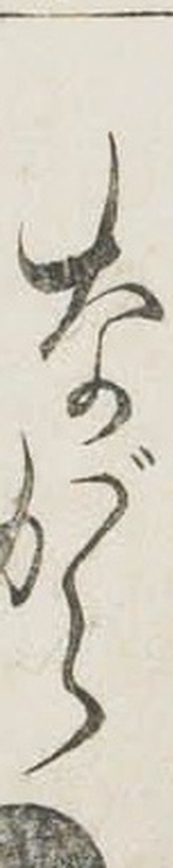ながら
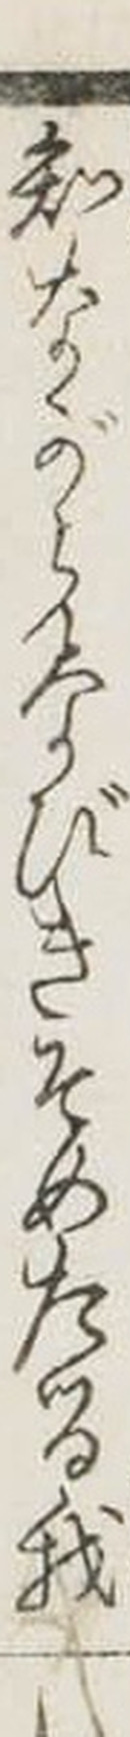知ながらなびきそめたる我
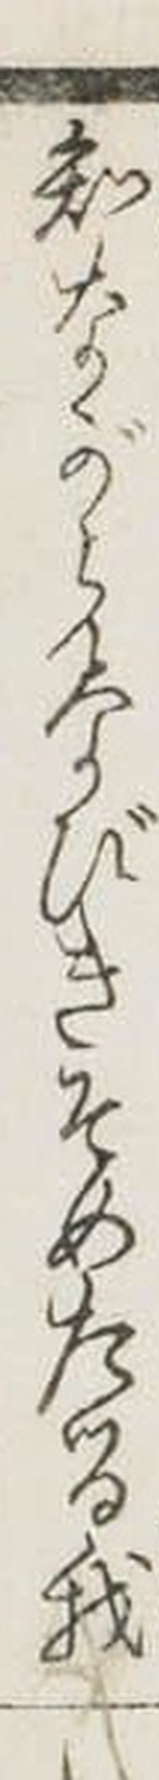知ながらなびきそめたる我
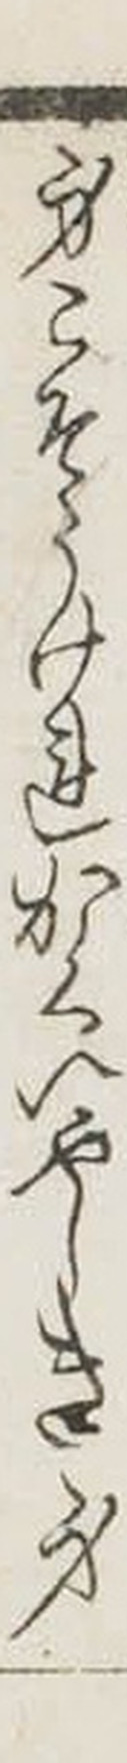身こそうけれかくいやしき身
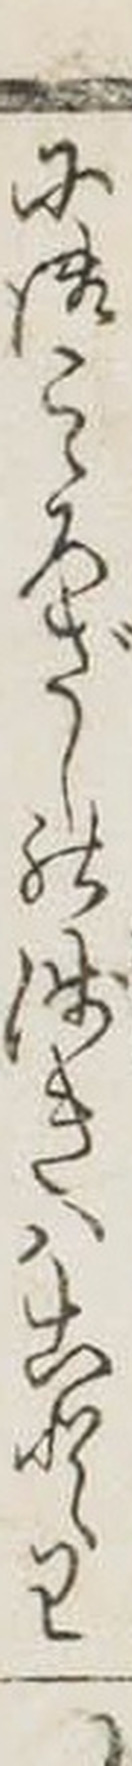に御こゝろざしの浅きはことわ
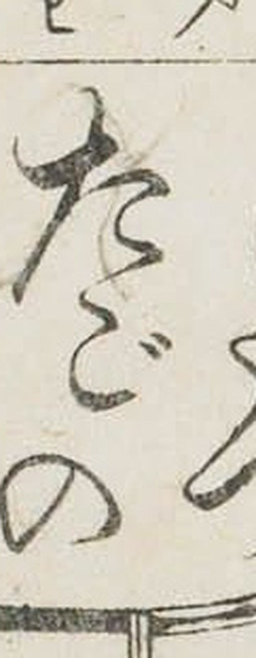たごの
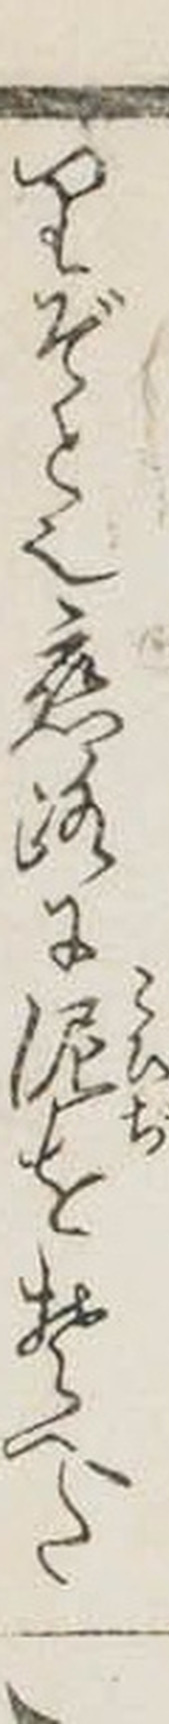りぞと也恋路に泥をそへた
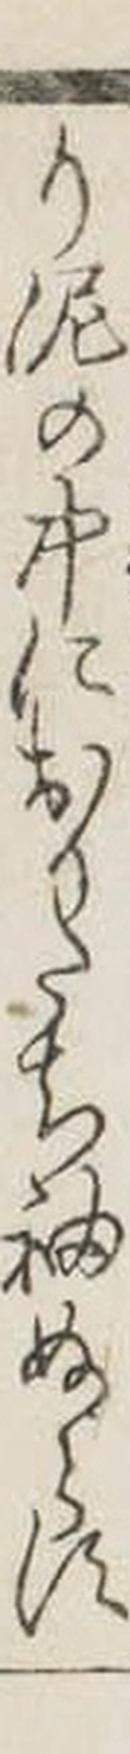り泥の中におりたち袖ぬらす
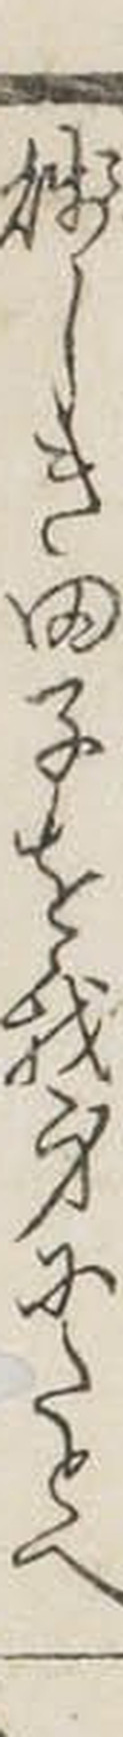賎しき田子を我身にたとへ
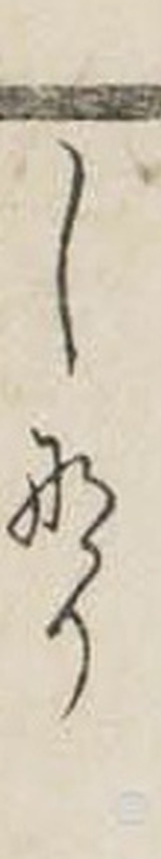しなり

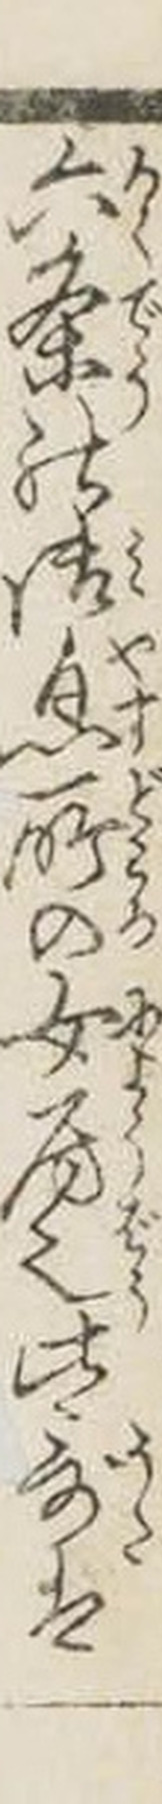六条の御息所の女房也此哥は
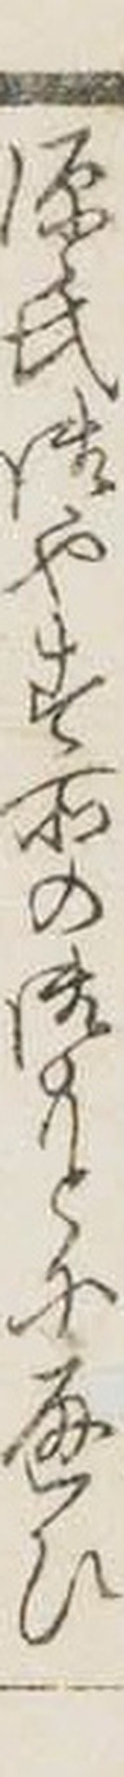源氏御やす所の御もとに通ひ
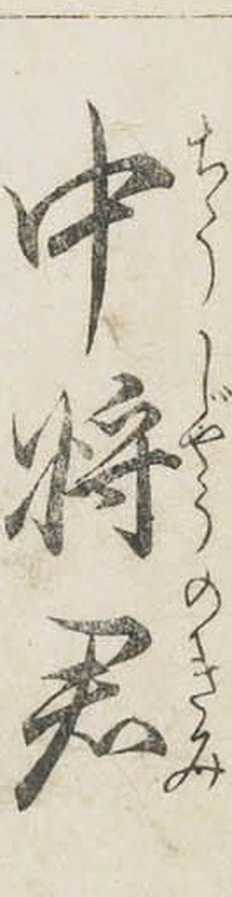中将君
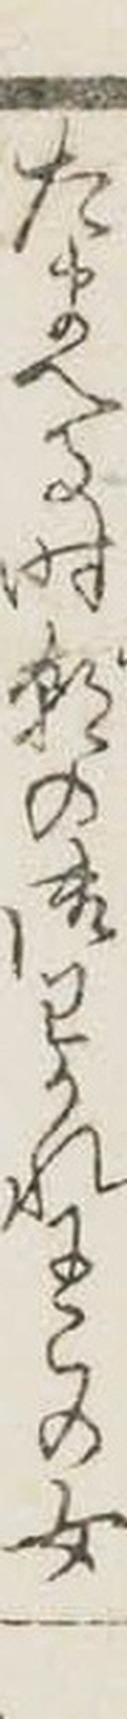たまへる時朝の御わかれにこの女
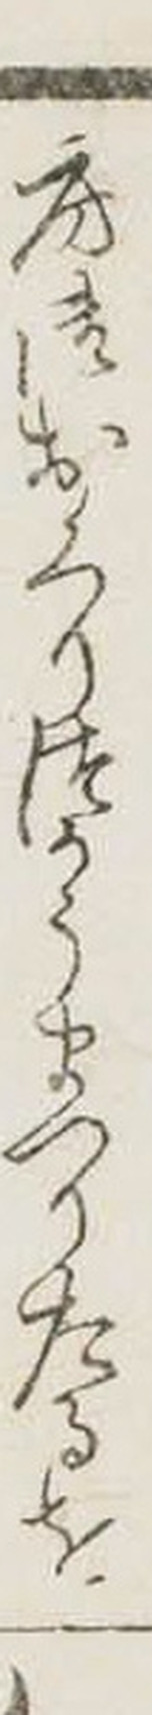房御おくりつかうまつりたるを
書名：源氏百人一首
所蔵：東京学芸大学教育コンテンツアーカイブ
